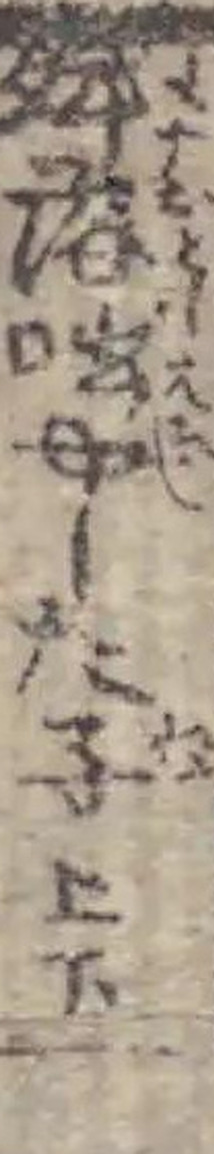舛落咄やした子上下
